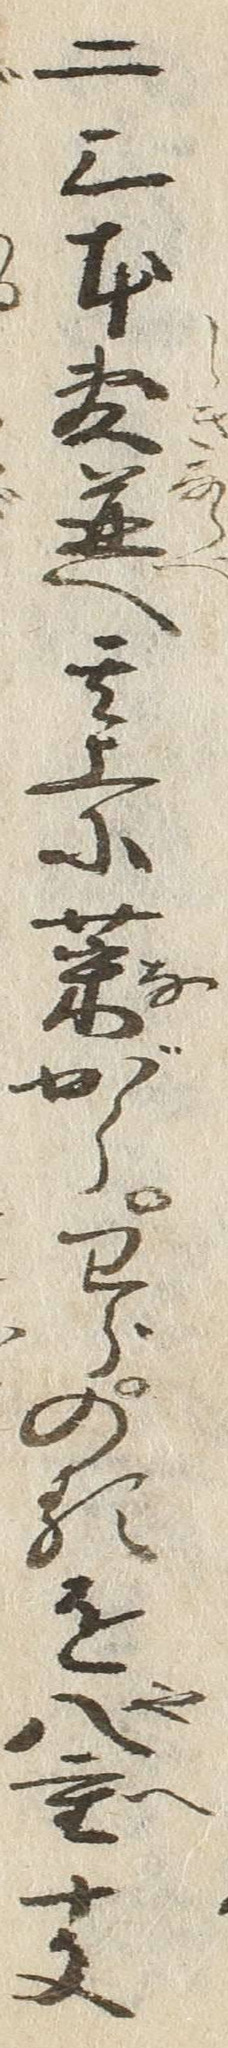二三本敷並べ其上尓菜がら。わら。の類を八重十文
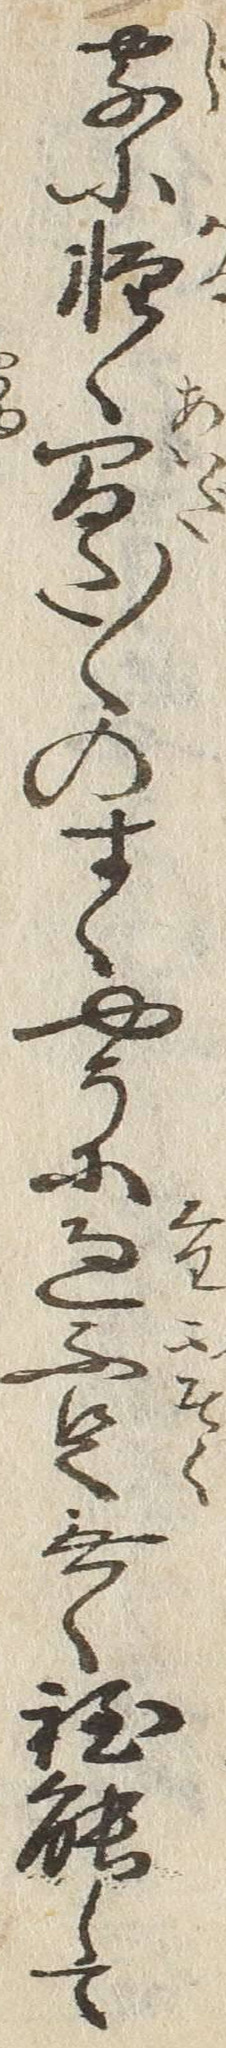字尓軽く間だ〳〵のすくやう尓過不足無く程能して
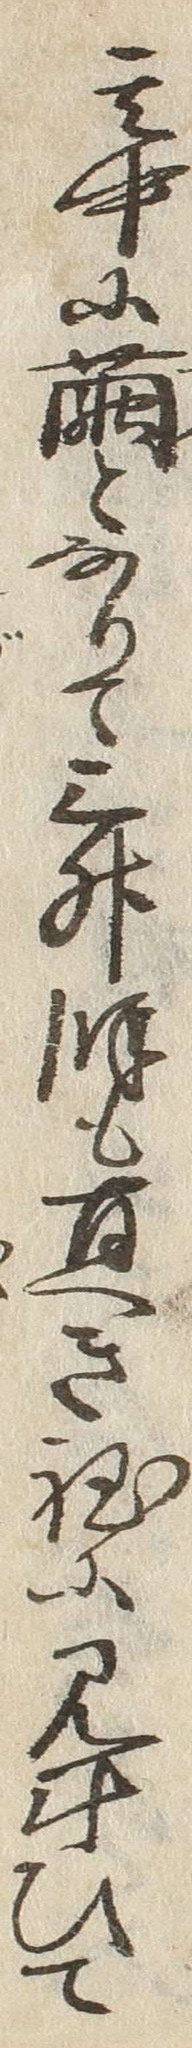其中尓繭となりて蠺三升餘も有へき程尓見計ひて
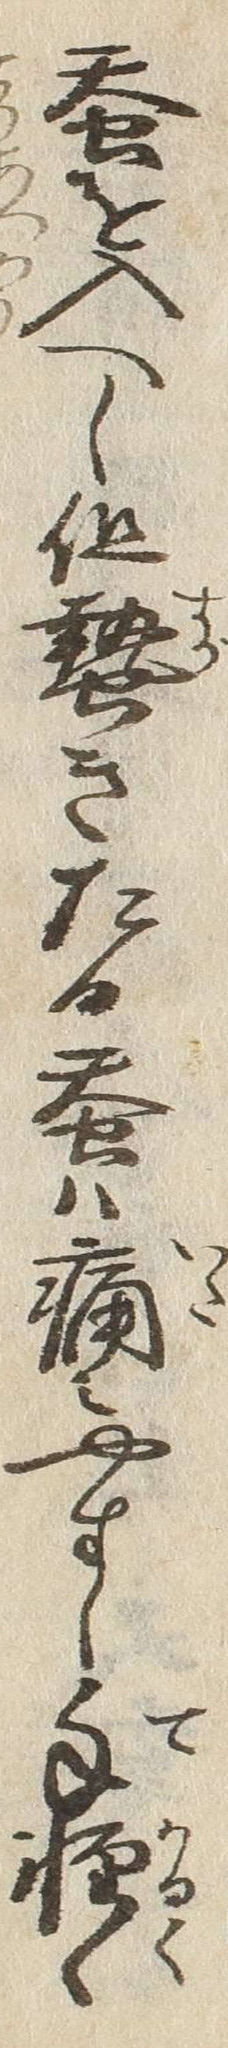蚕を入へし但蟄きたる蚕は痛みやすし手軽く
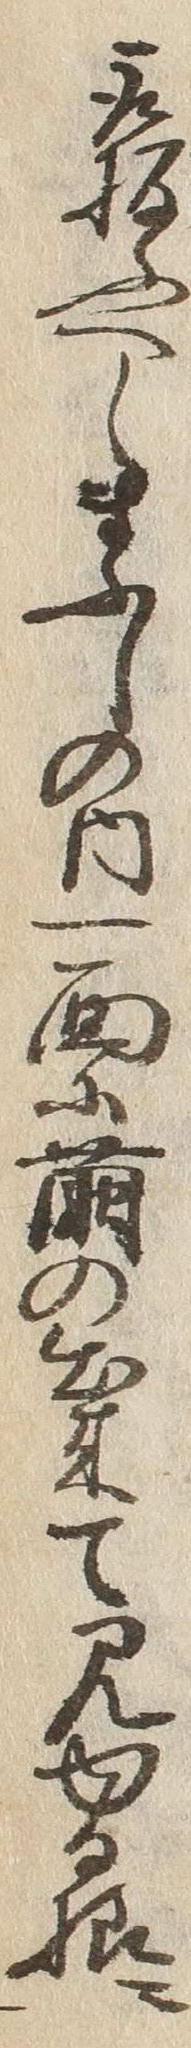取扱ふへしまふしの内一面尓繭の出来て見ゆる様に

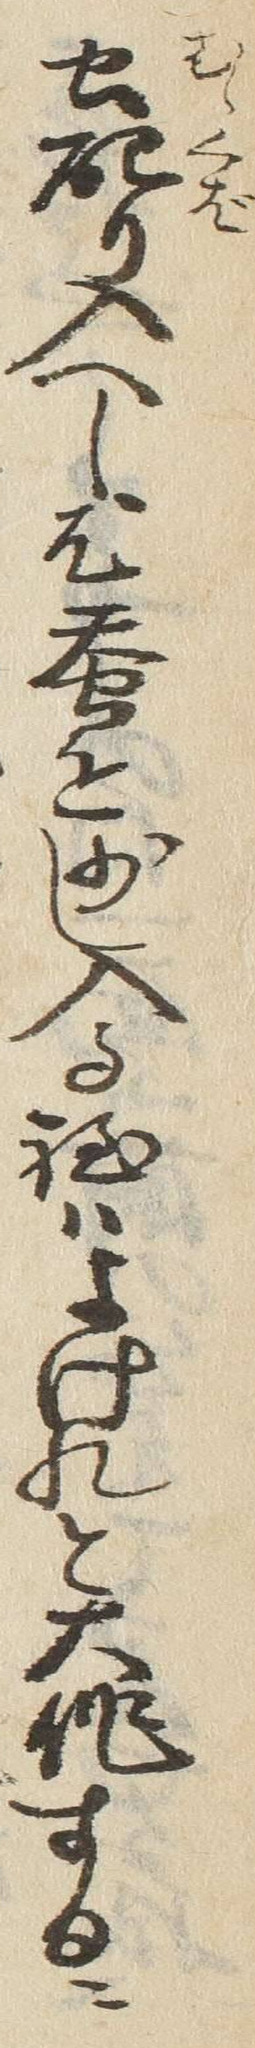虫配り入へし尤蚕を少し入る程はよけれと大作するに
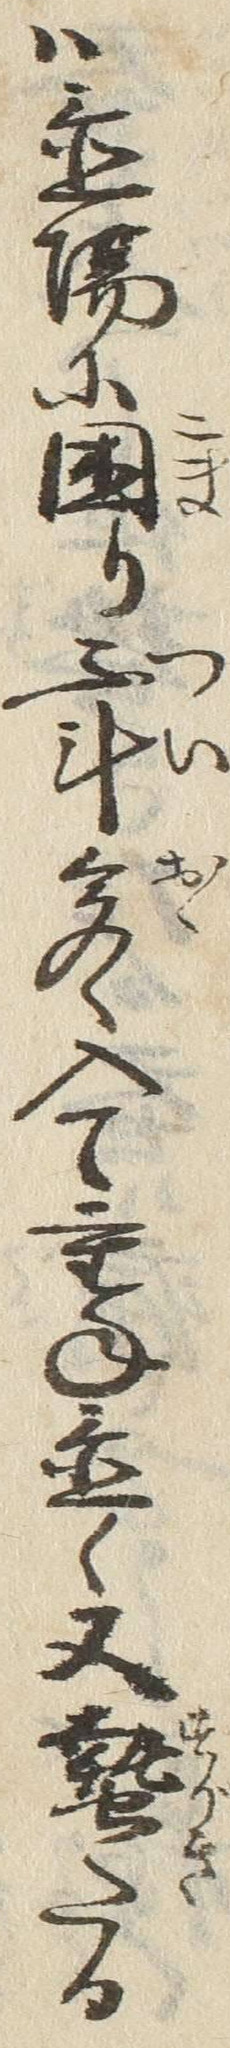は置場尓困り不斗多く入て重年置く又蟄たる
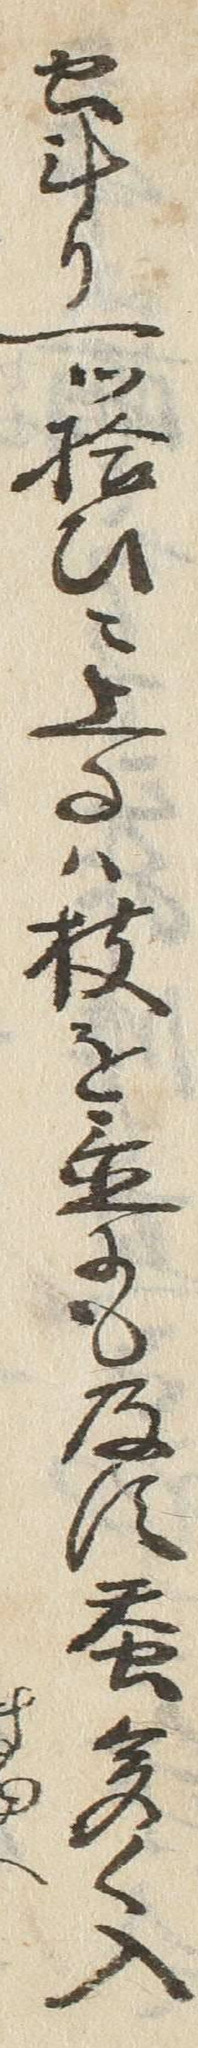虫斗り一ツ拾ひに上るは枝を置尓も及須蚕多く入
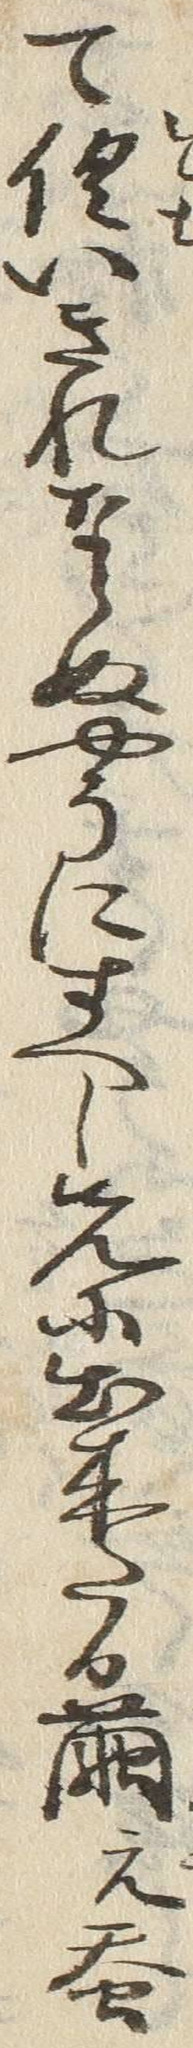て倶いきれならぬやうにすへし先尓出来たる繭え蚕
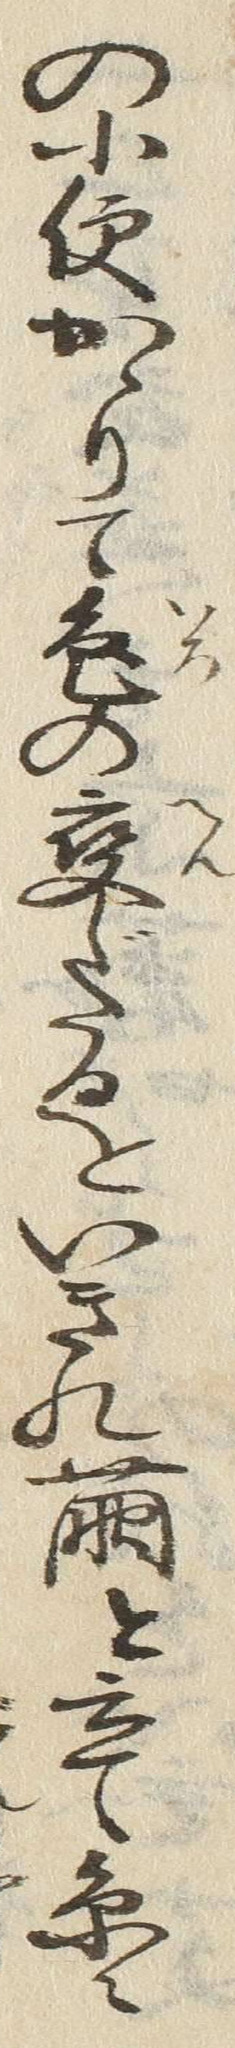の小便かゝりて色の變じたるをいきれ繭と云て糸に
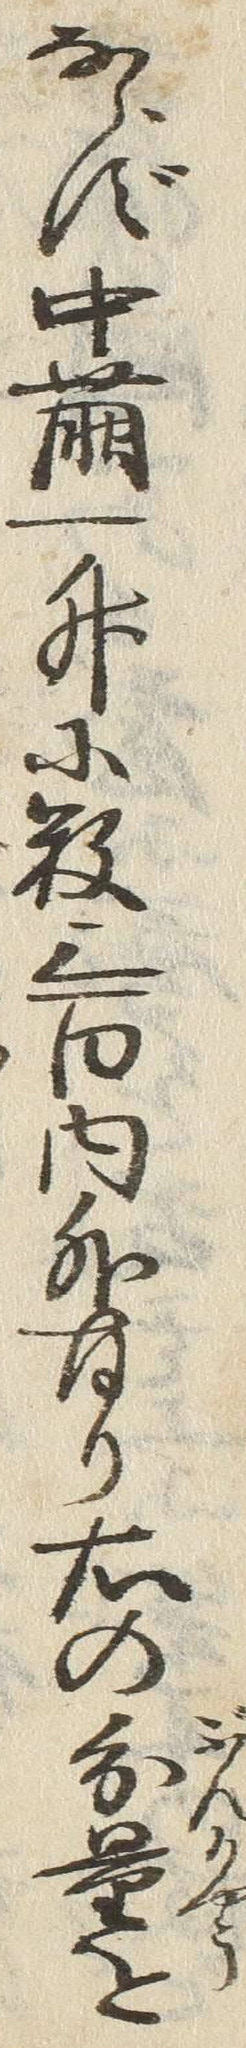ならず中繭一升尓数三百内外なり右の分量を
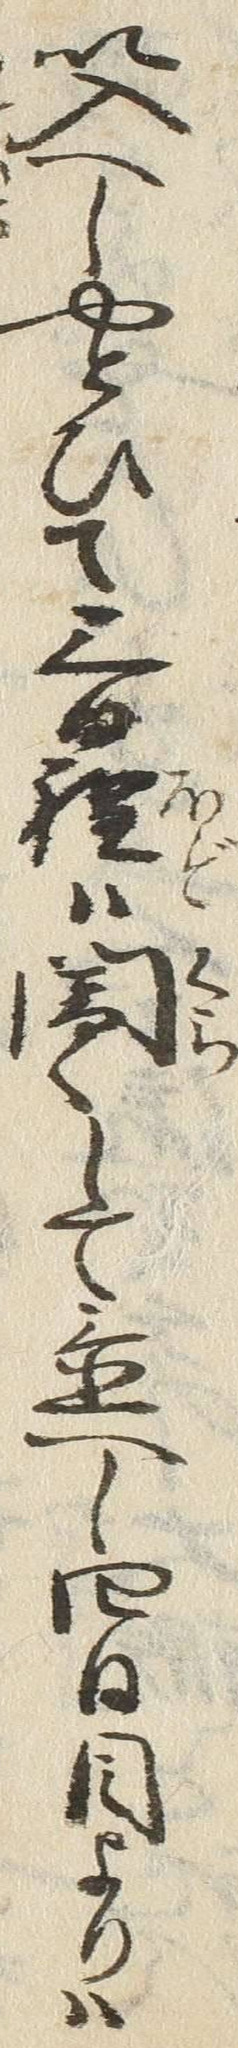以入へしやとひて三百程は闇くして置へし四日目よりは
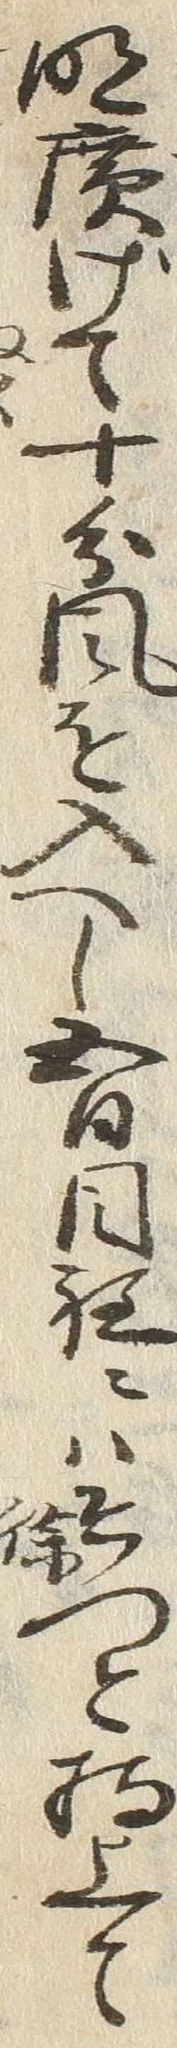明廣げて十分風を入へし五日目程にはそつと持上て
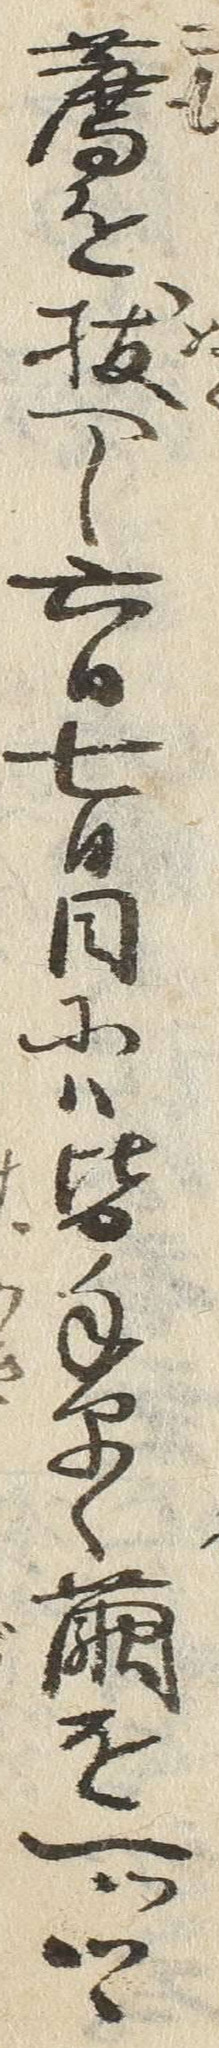薦を抜へし六日七日目尓は皆手早く繭を一ツつゝ
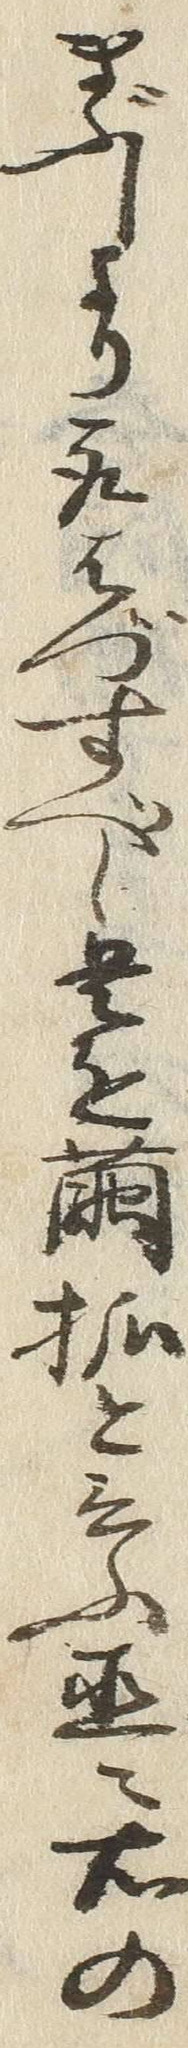まぶしより取はづすべし是を繭抓と云ふ直に右の
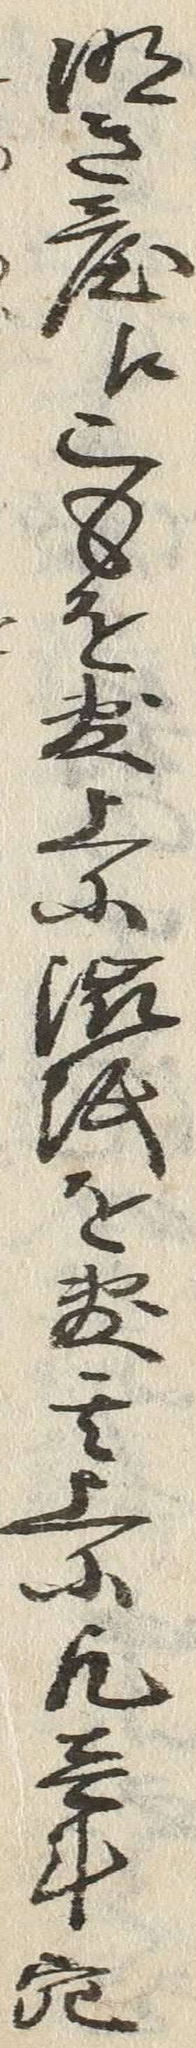明き臺江こもを敷上尓渋紙を敷其上尓凡壱升宛
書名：養蠶實驗録後編
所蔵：東京大学農学生命科学図書館 国文学研究資料館
